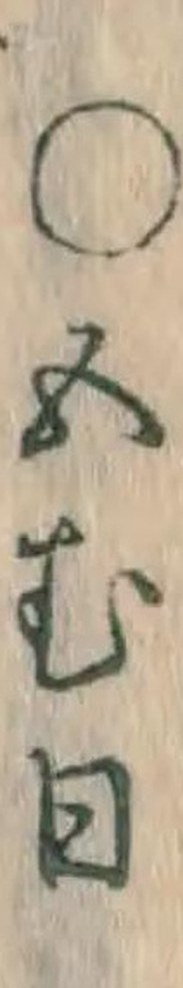○五む日
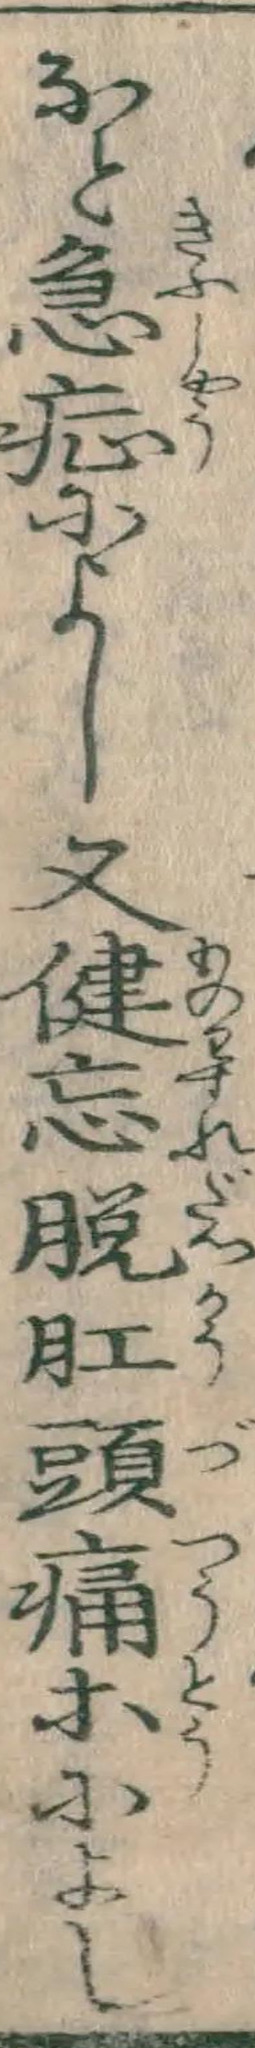なと急症によし又健忘脱肛頭痛等によし
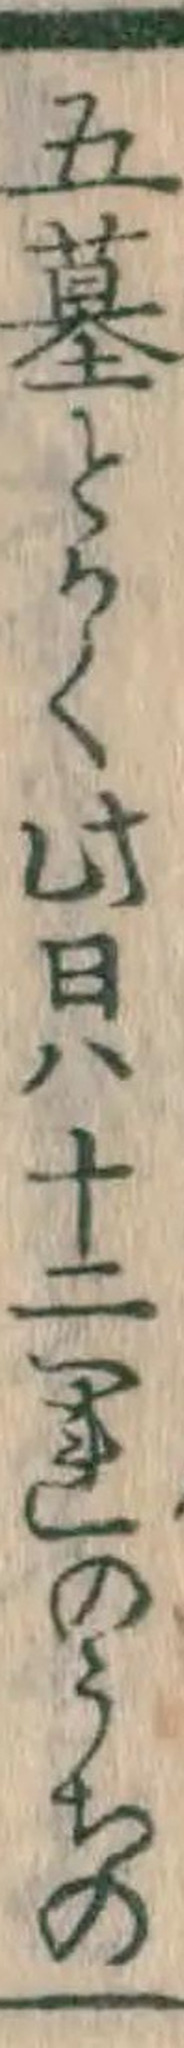五墓とかく此日は十二運のうちの
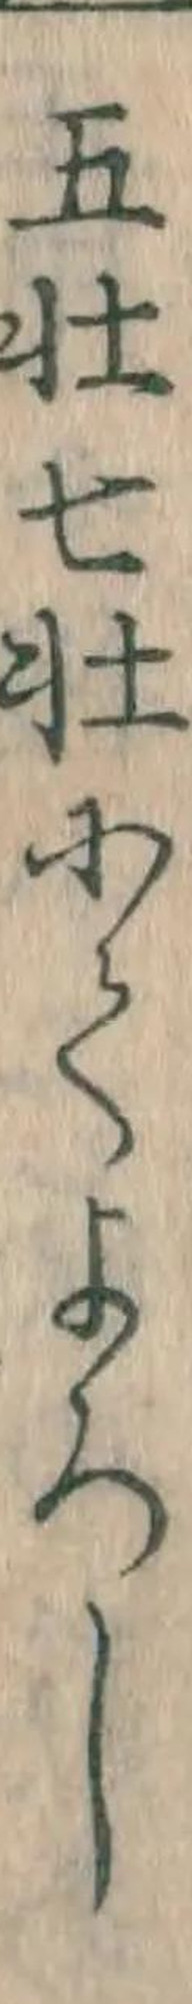五壮七壮にてよろし
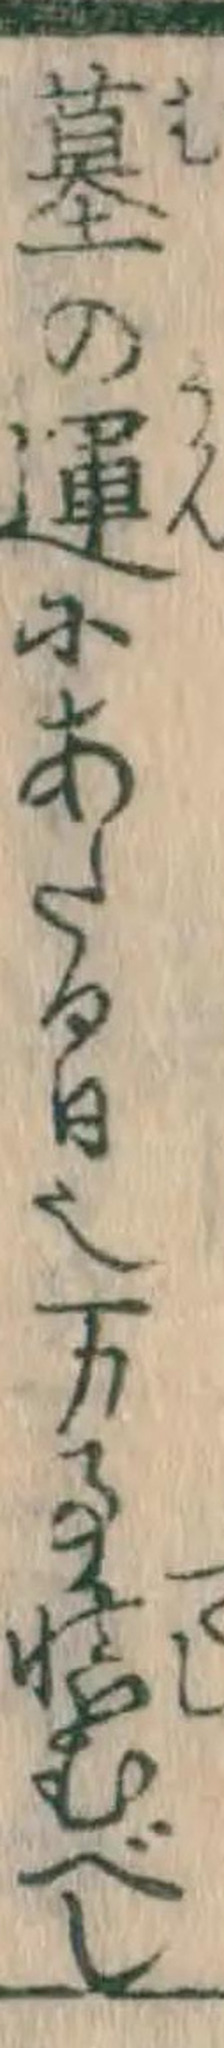墓の運にあたる日也万事慎むべし
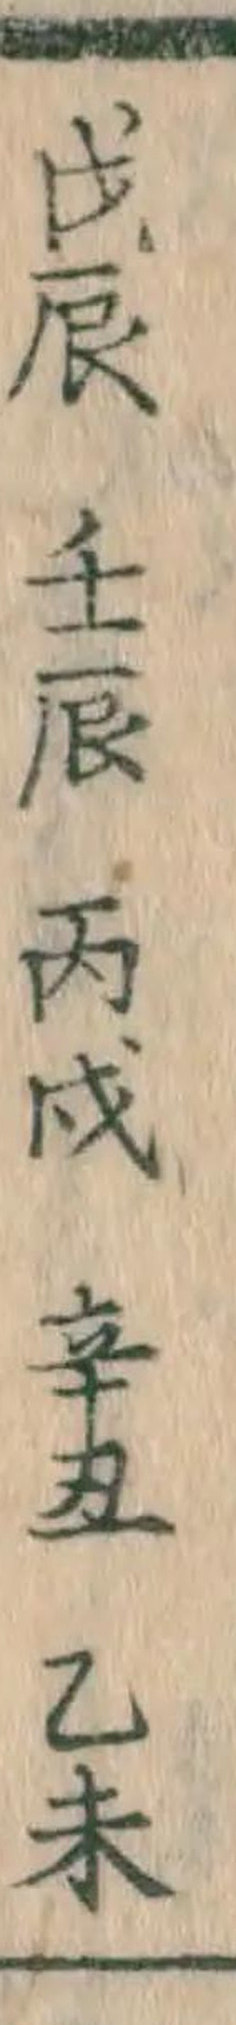戊辰壬辰丙戌辛丑乙未
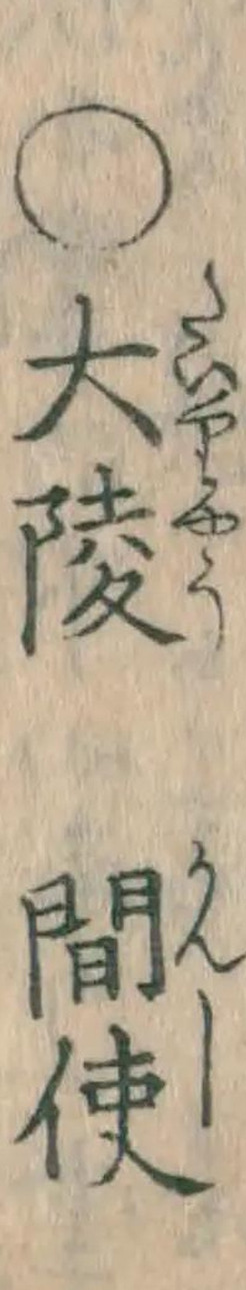○大陵間使

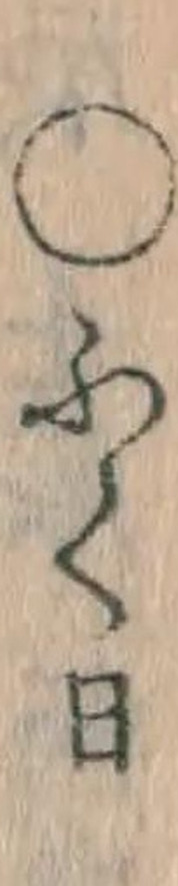○ふく日
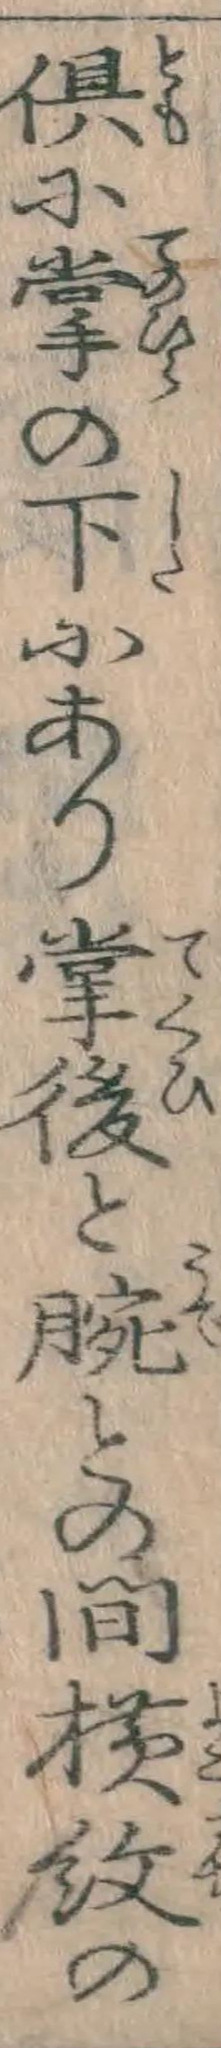俱に掌の下にあり掌後と腕との間横紋の
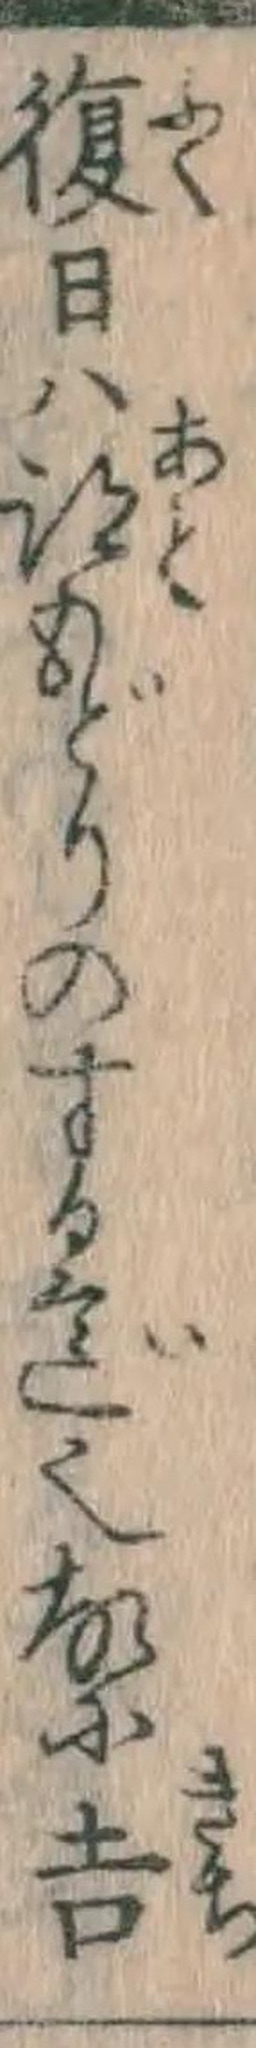復日は跡もどりのする意也故に吉
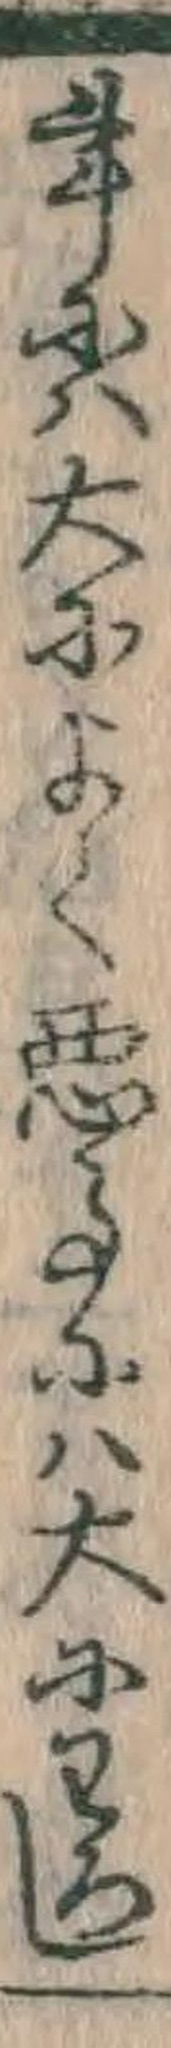事には大によく悪事には大にわろし
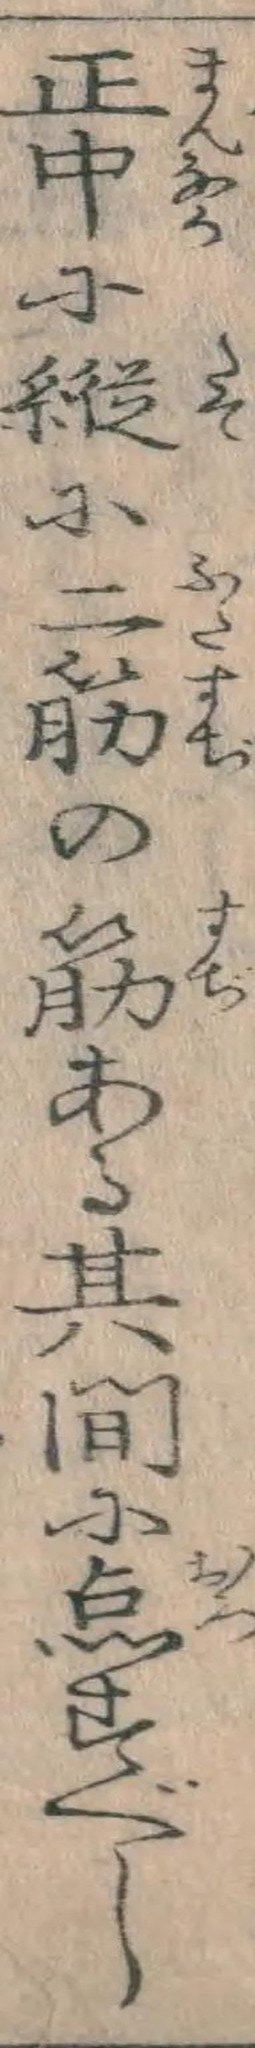正中に縦に二筋の筋ある其間に点すべし
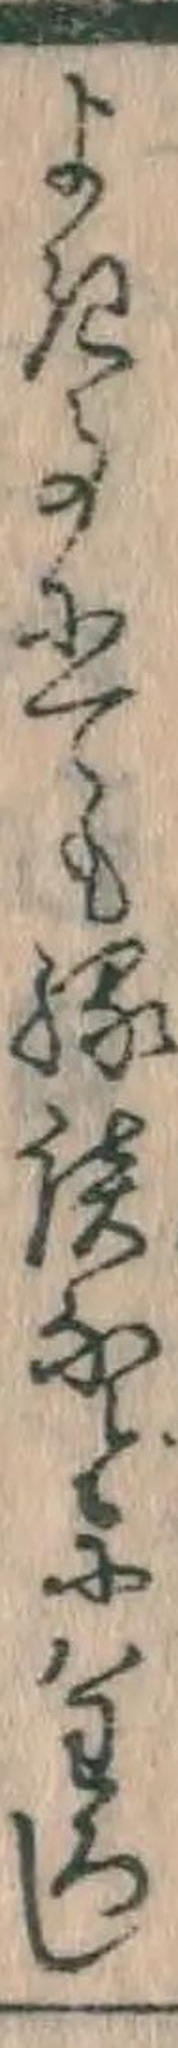よき事にても縁談などにはわろし
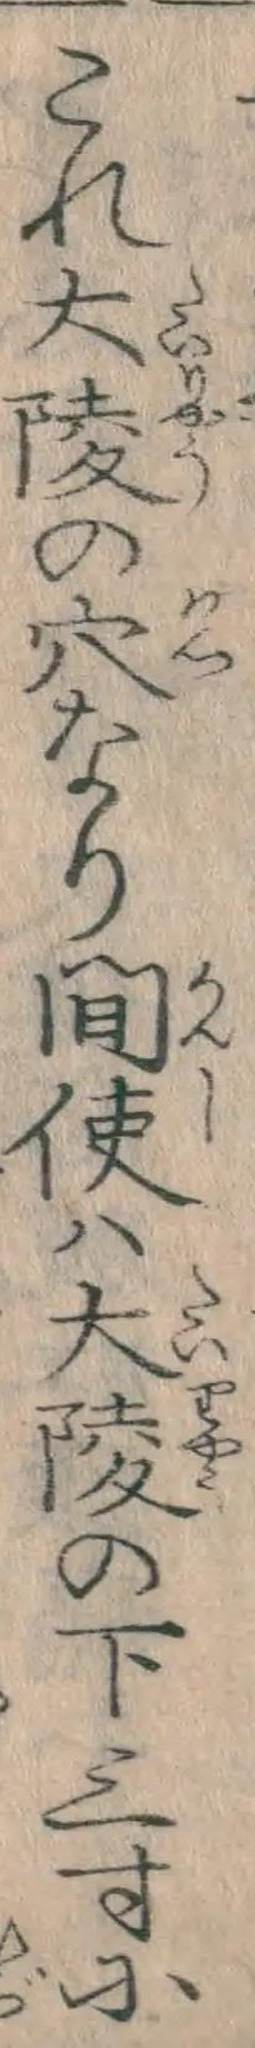これ大陵の穴なり間使は大陵の下三寸に
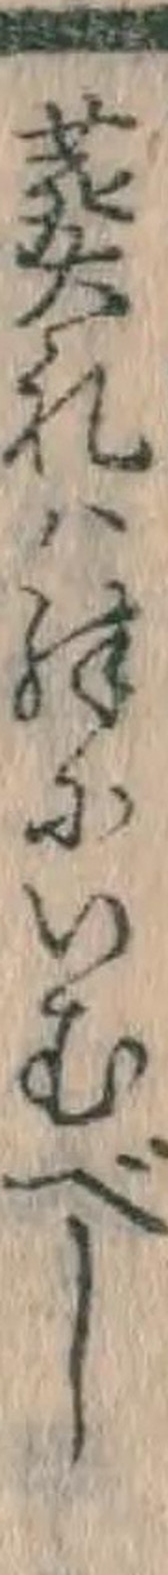葬礼は殊にいむべし
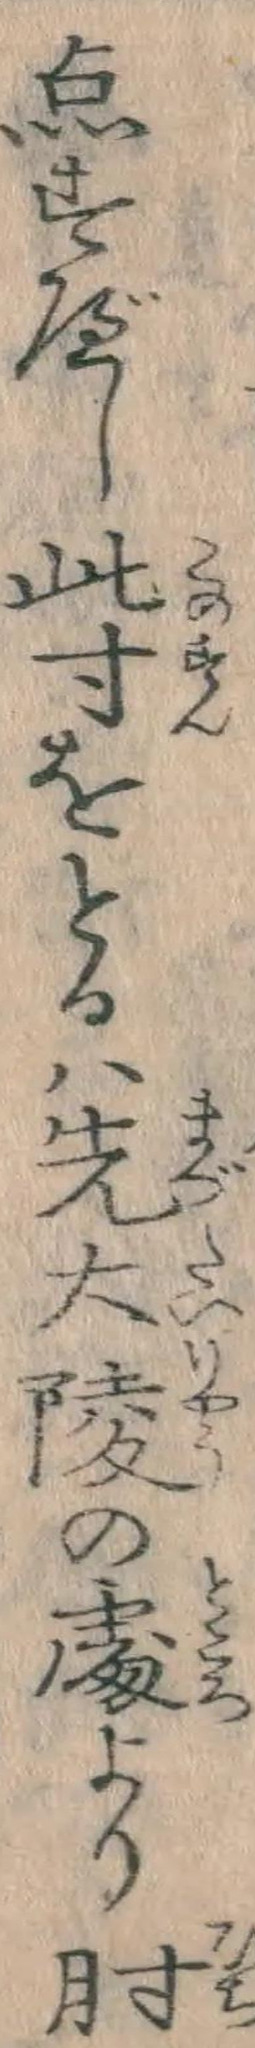点すべし此寸をとるは先大陵の処より肘
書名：広益秘事大全 3巻. [4]
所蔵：国立国会図書館 National Diet Library, JAPAN
